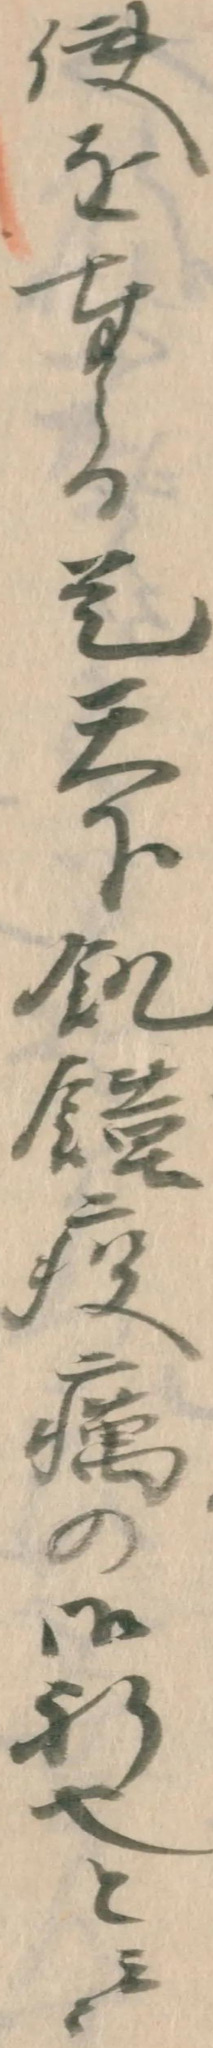使を奉らる是天下飢饉疫癘の御祈也と云々
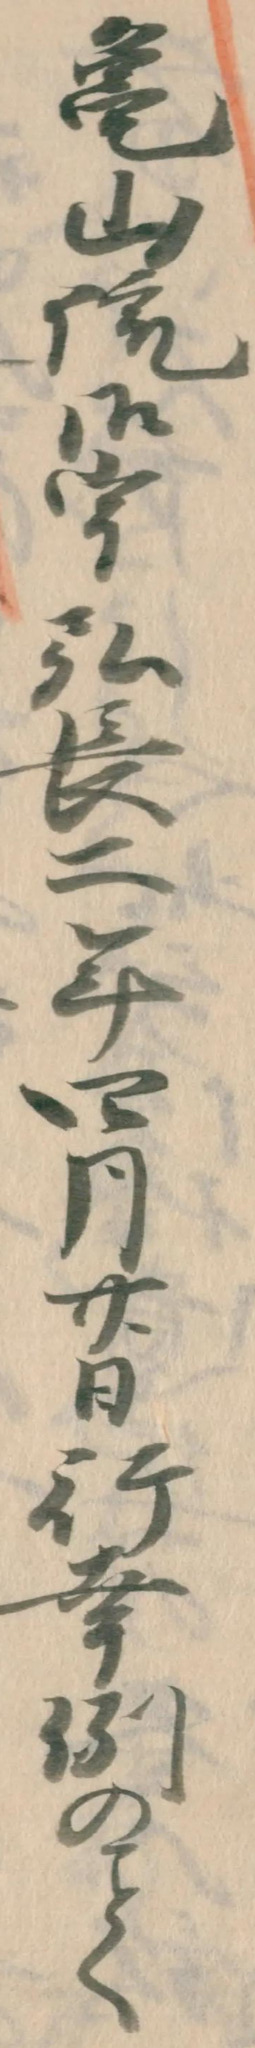亀山院御宇弘長二年四月廿日行幸例のことく
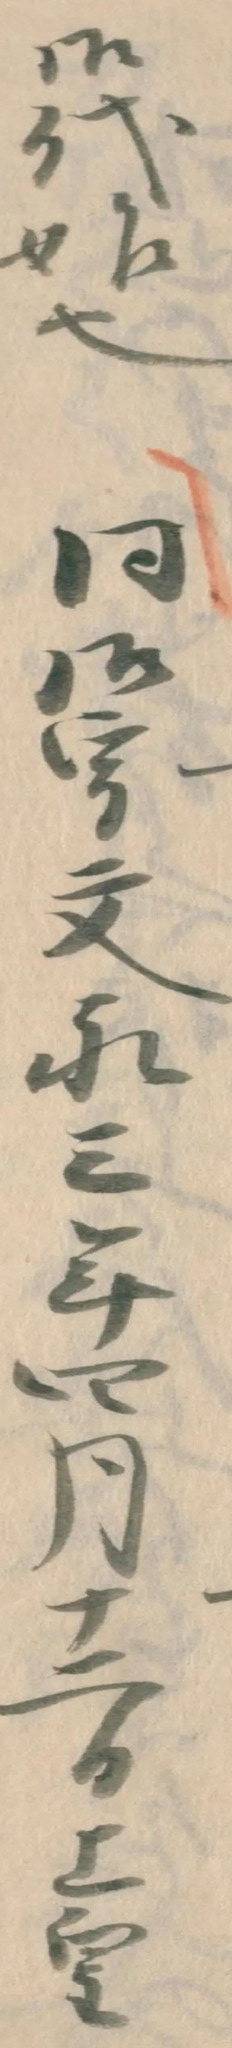御代始也同御宇文永三年四月十二日上皇
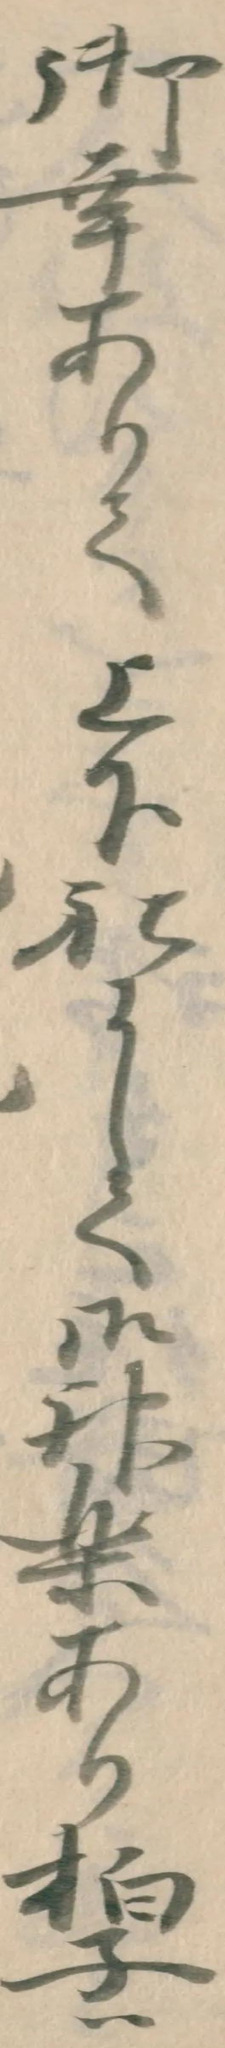御幸ありて上下社にして御神楽あり拍子は
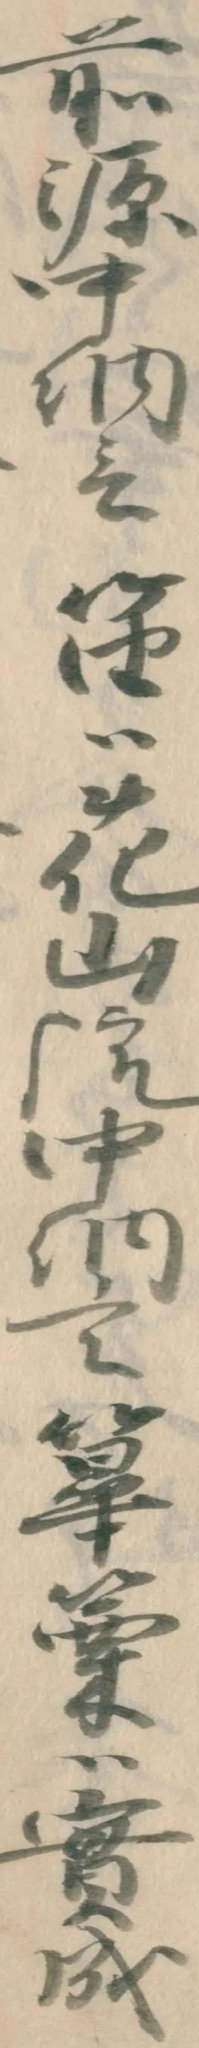前源中納言笛は花山院中納言篳篥は実成
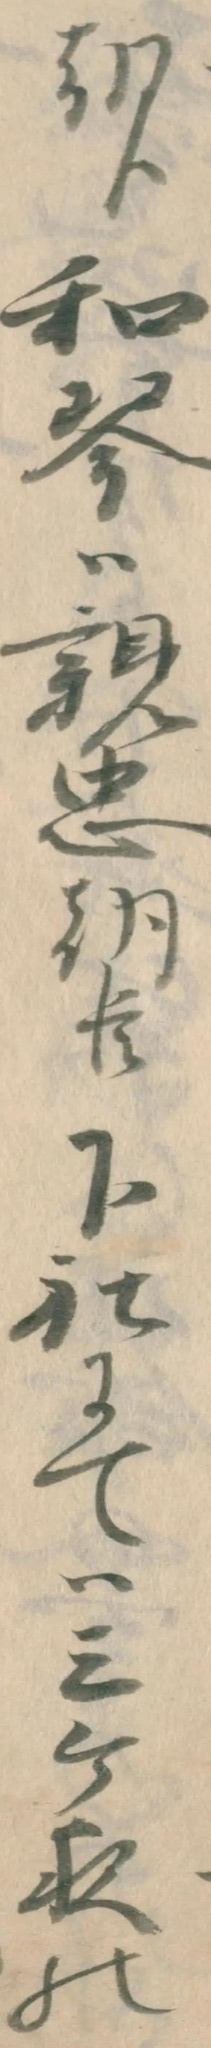朝臣和琴は親忠朝臣下社にては三ヶ夜の
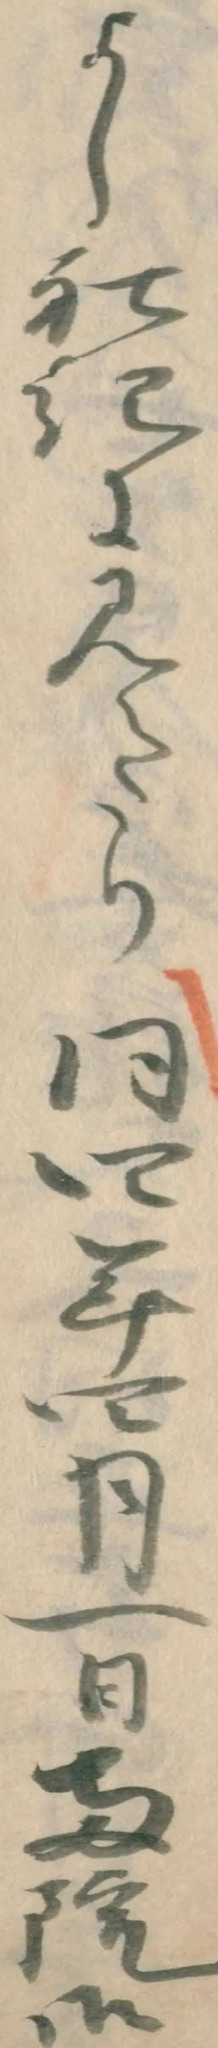よし社記に見えたり同四年四月一日両院御

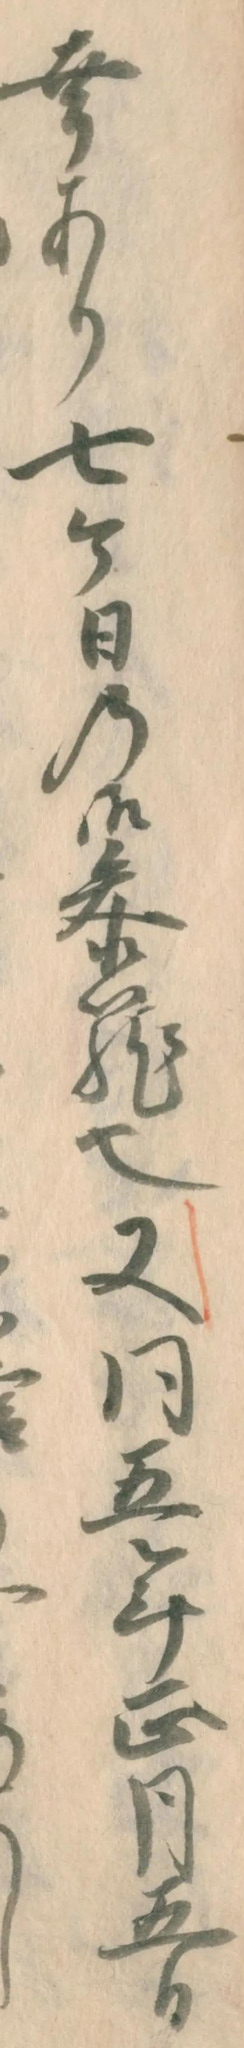幸あり七ヶ日の御参籠也又同五年正月五日
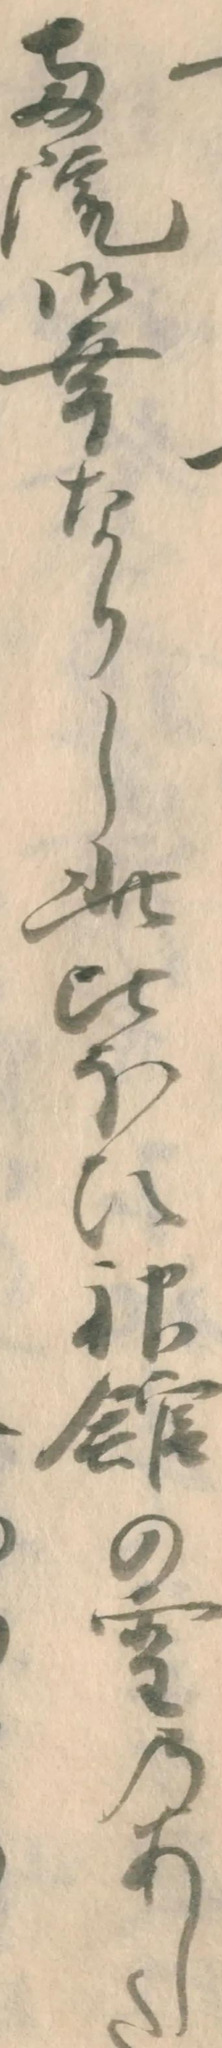両院御幸なりし此比ほひ神館の雪のあした
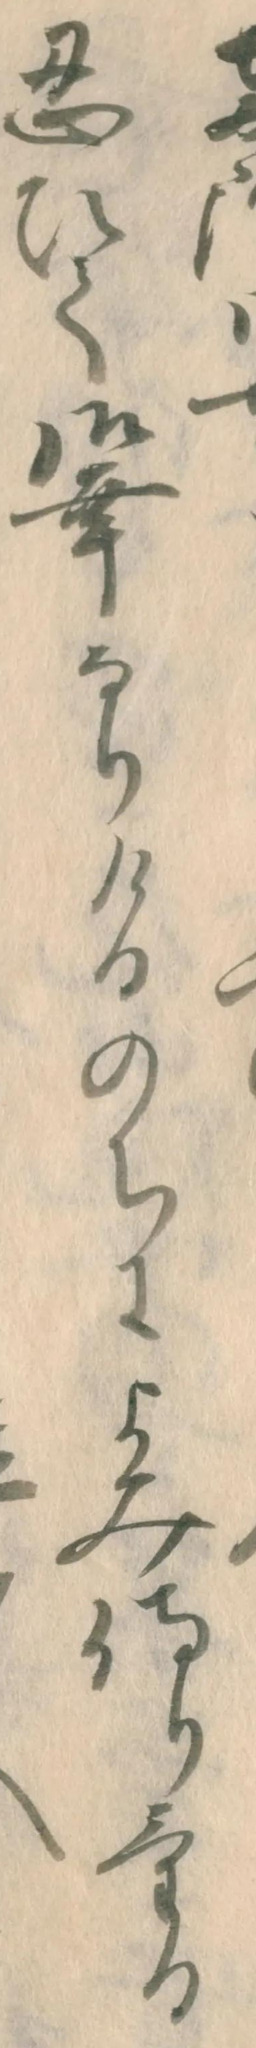忍ひて御幸なりけるのちによみ侍りける
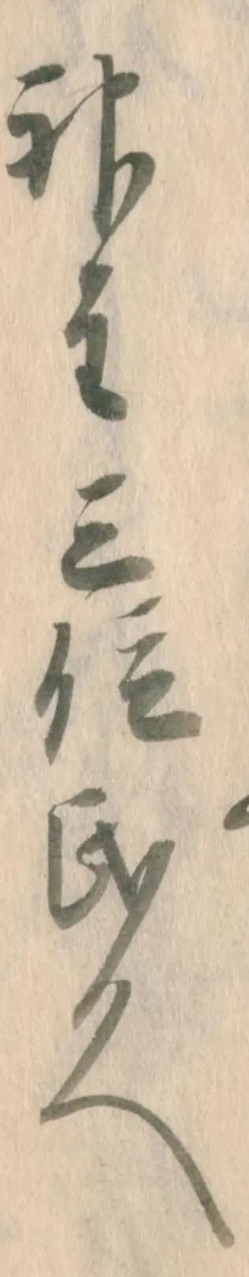神主三位氏久
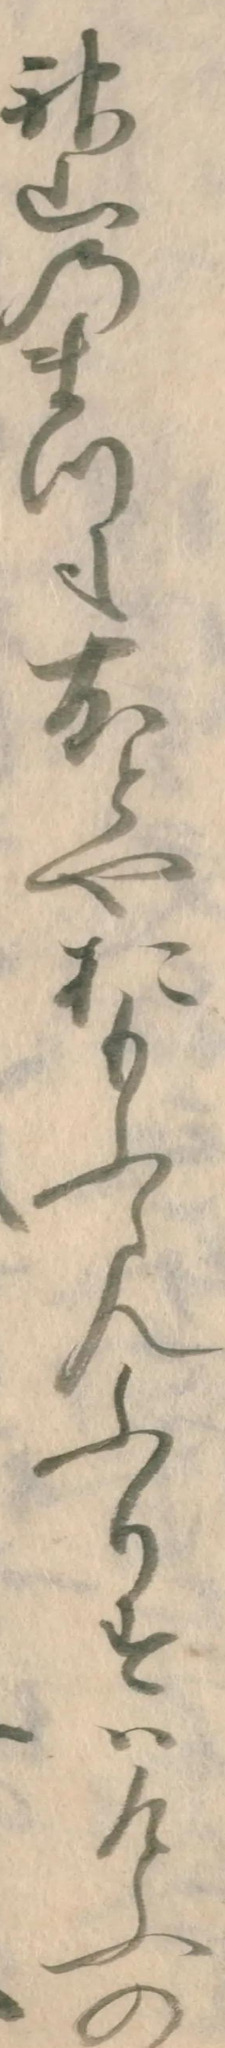神山のまつも友とやおもふらんふりすはけふの
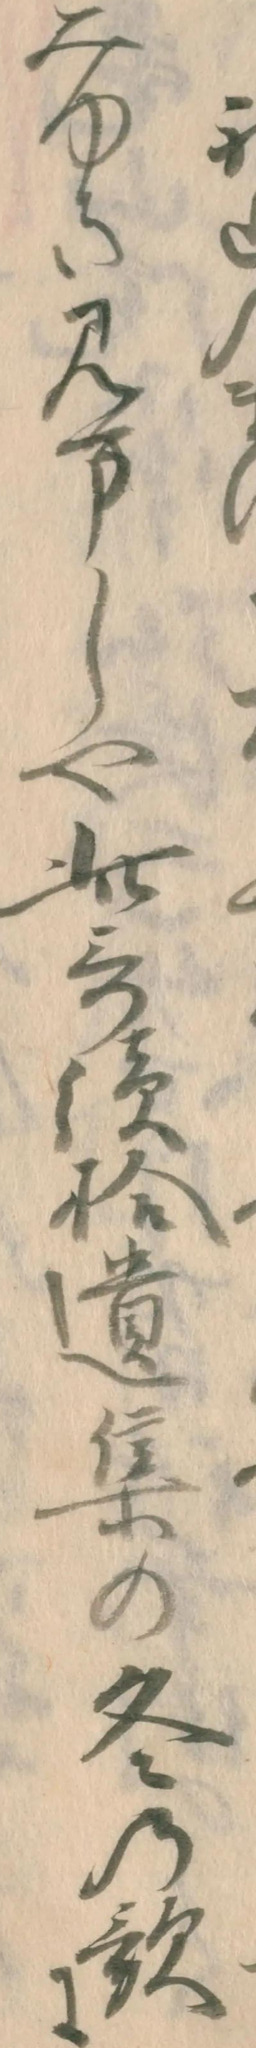みゆきみましや此哥続拾遺集の冬の歌に
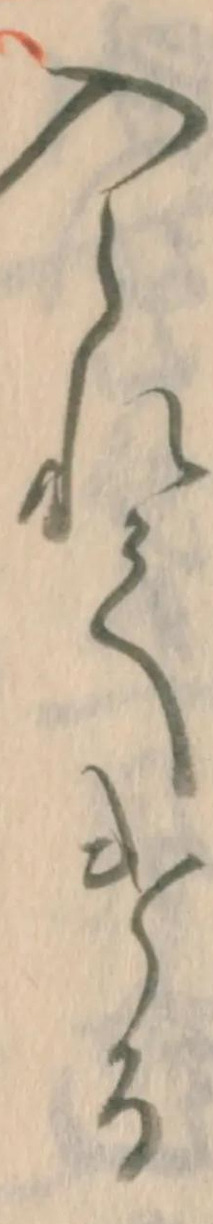入られてける
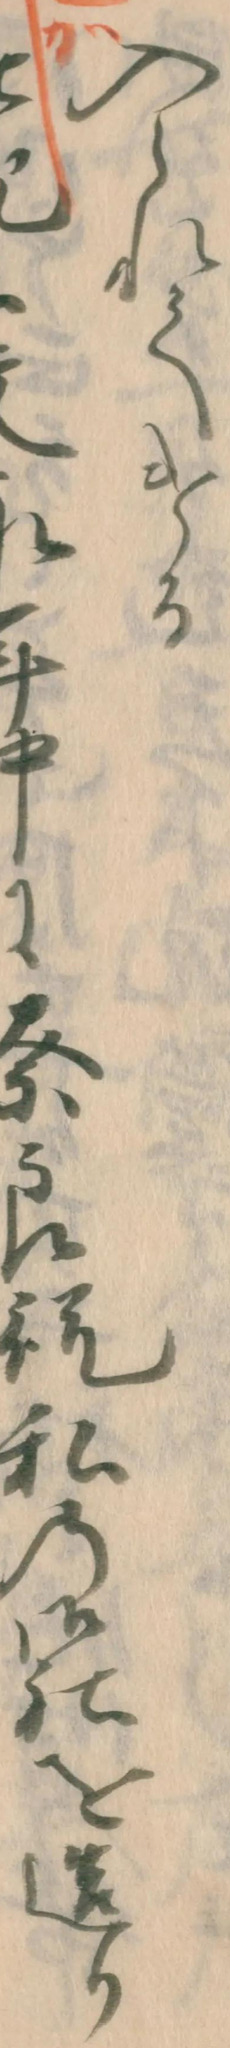社記云文永年中に奈良祝私の御社を造り
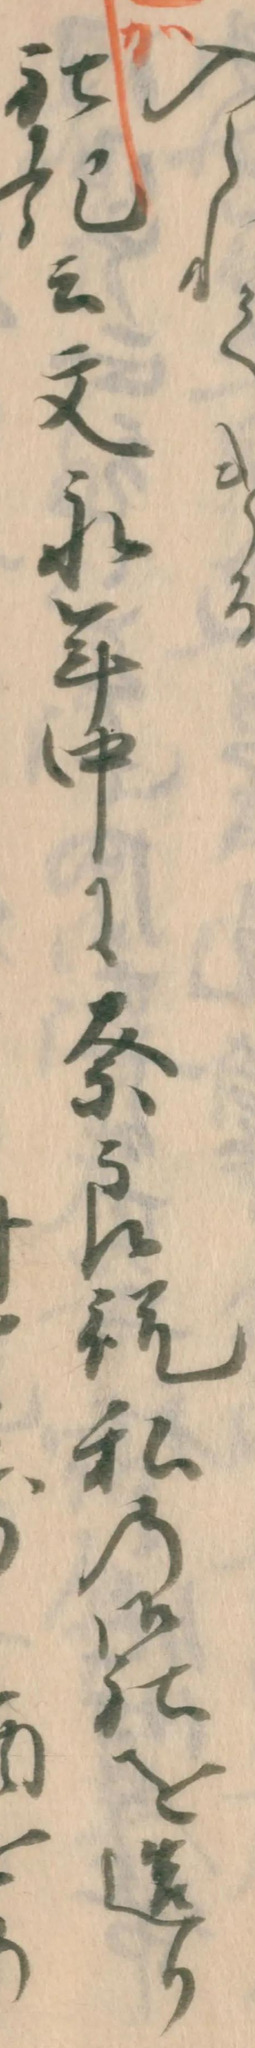社記云文永年中に奈良祝私の御社を造り
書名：賀茂社記録. 第1冊
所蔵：国立国会図書館 National Diet Library, JAPAN
